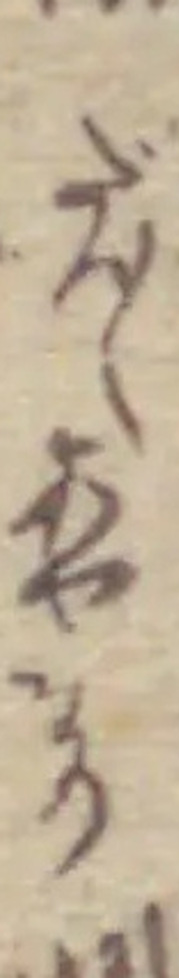だん〳〵あやまり
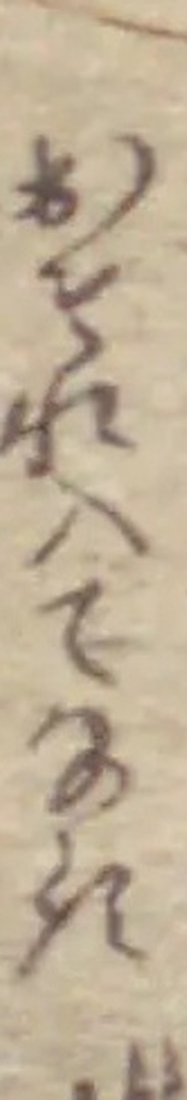おそれ入てなき
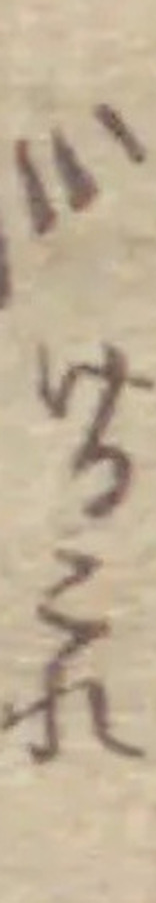けるこれ
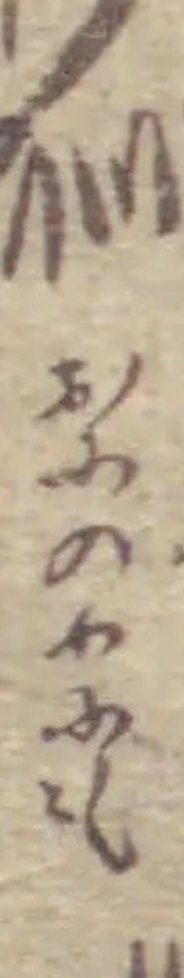おにのめにも
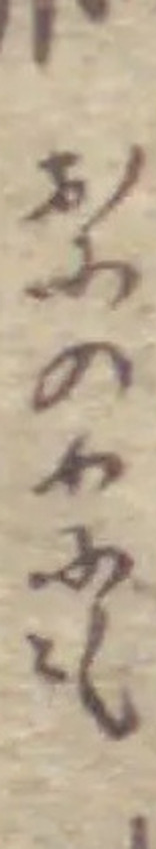おにのめにも
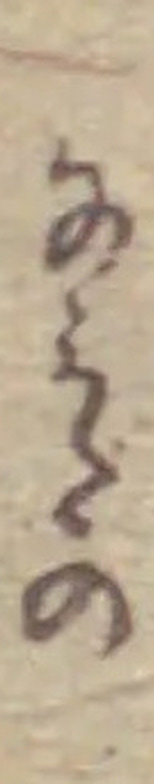なみだの
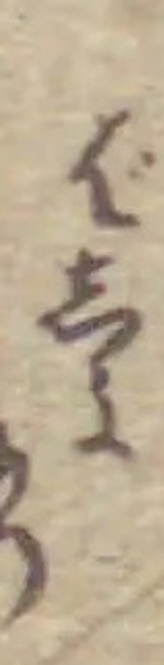はしよ

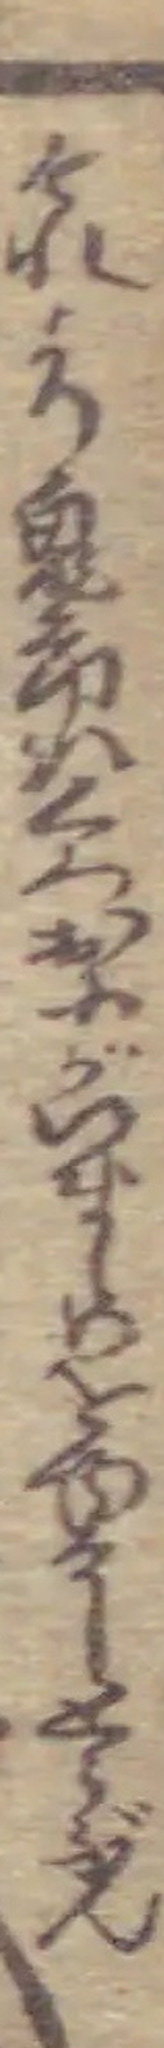それより鬼市はくろおにがいましめをゆるしとうぶん
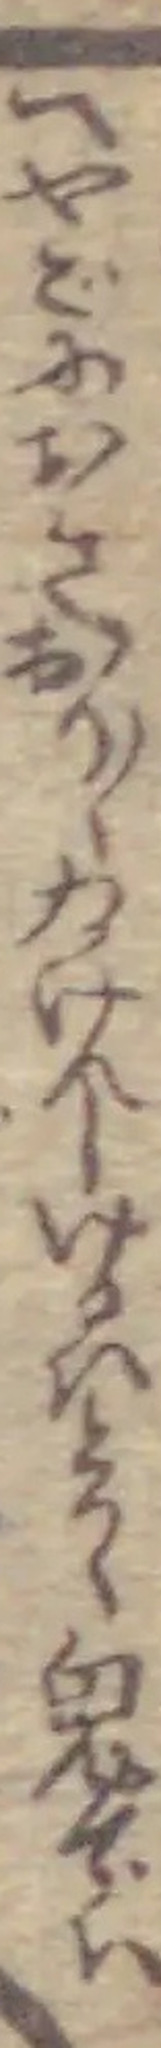へやどにおきおり〳〵ゐけんしけるはとかく鬼では
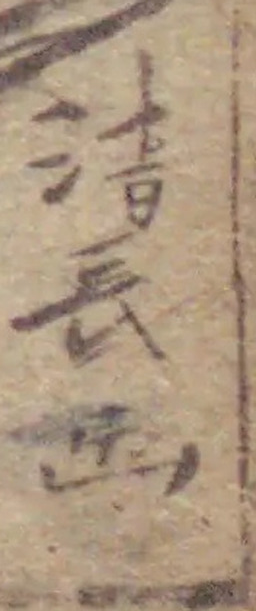清長画
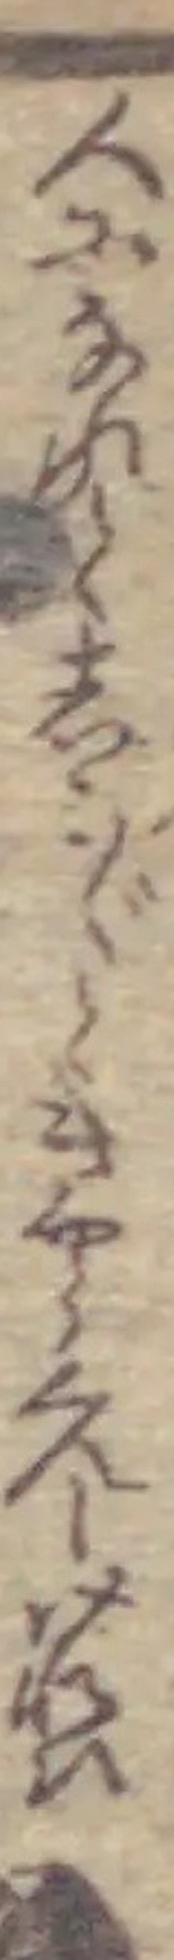人になれとし〴〵きやうくんしけれは
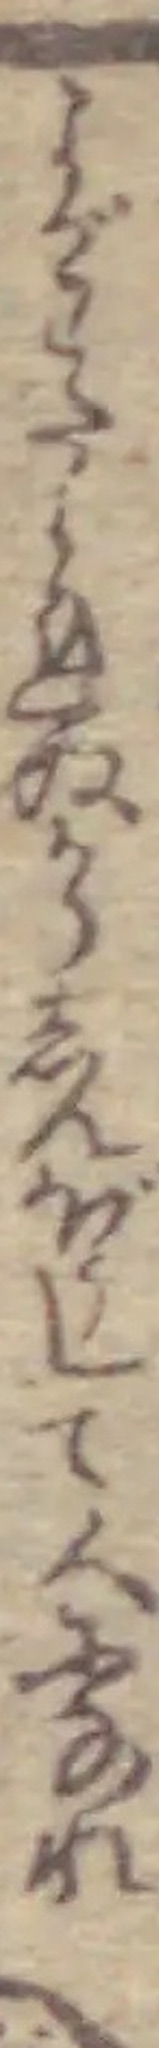よがわたられぬからしんぼうして人になれ
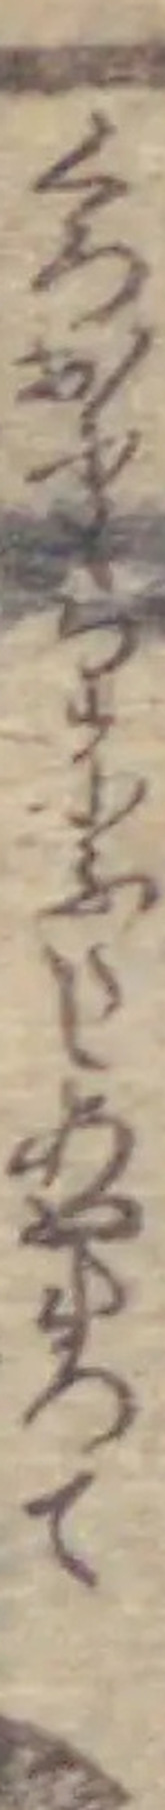くろおににふうしあやまつて
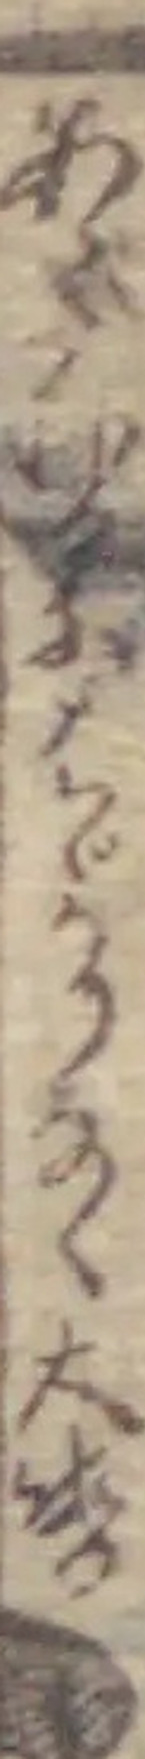あむるにはばかりなく大か
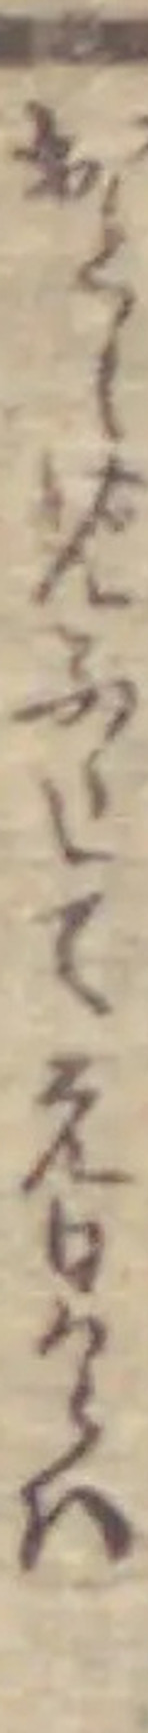おとしげんふくしてこん日からは
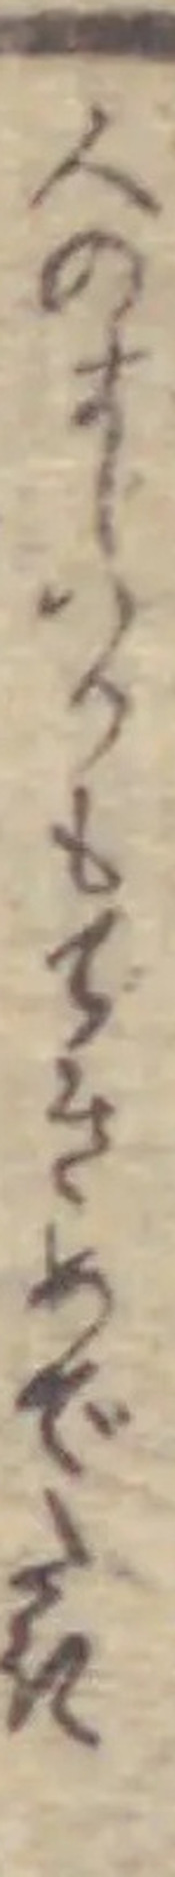人のまじはりもできめでたき
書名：鬼子宝 3巻
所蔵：国立国会図書館 National Diet Library, JAPAN
